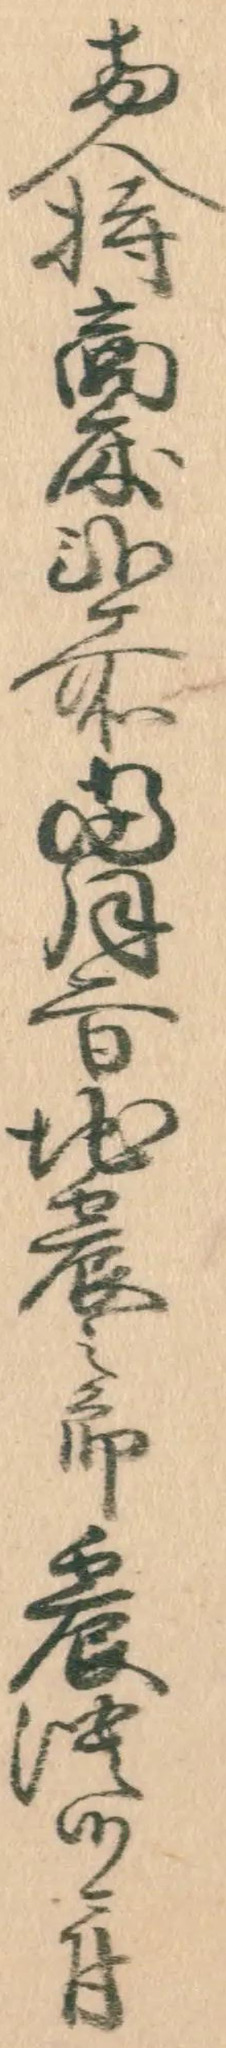両人持商床弐ケ所当月二日地震之節震潰候ニ付
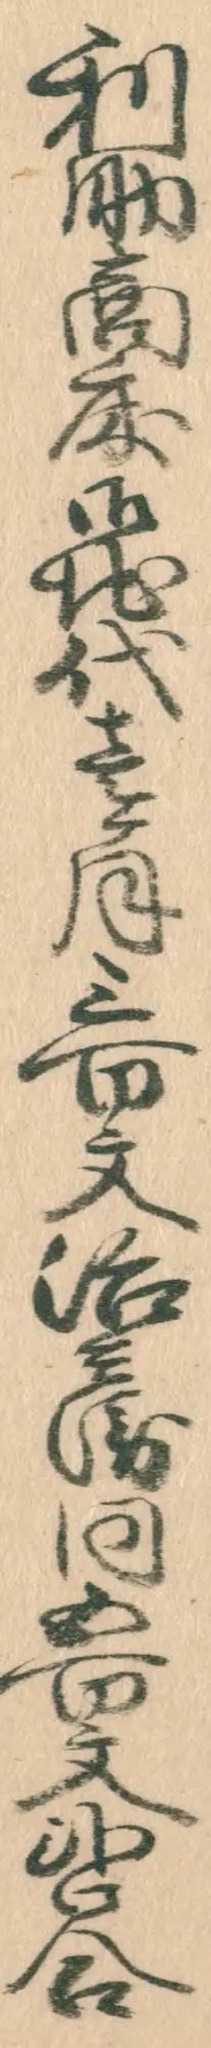利助商床御地代壱ケ月三百文治兵衛同五百文弐口合
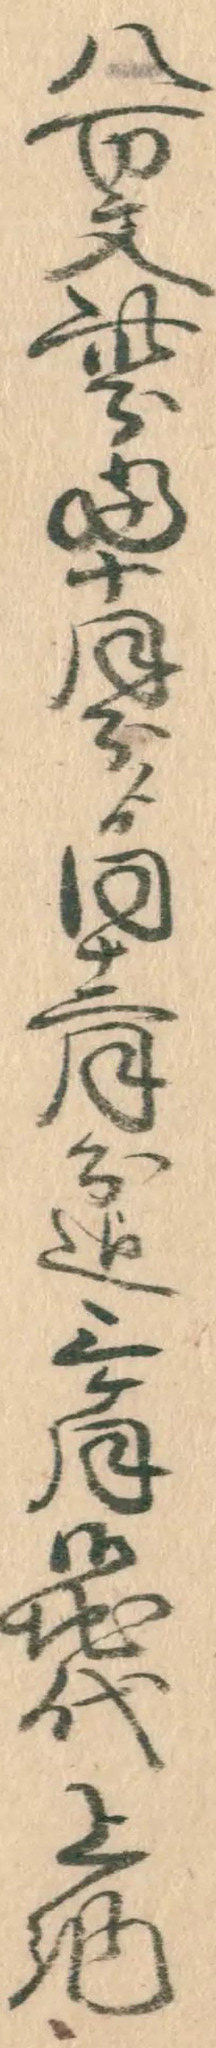八百文此分当十月分ゟ同十二月分迄三ケ月御地代上納
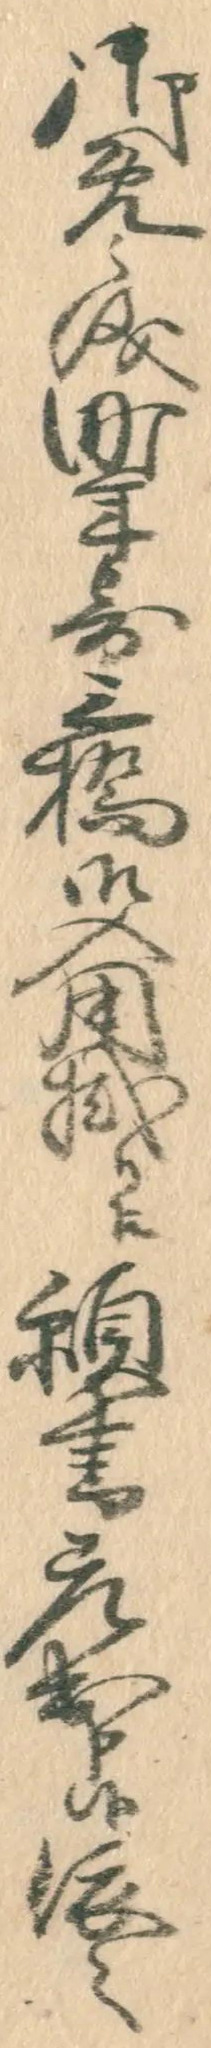御免之儀町年寄三橋御入用掛りえ願書差出申候依之
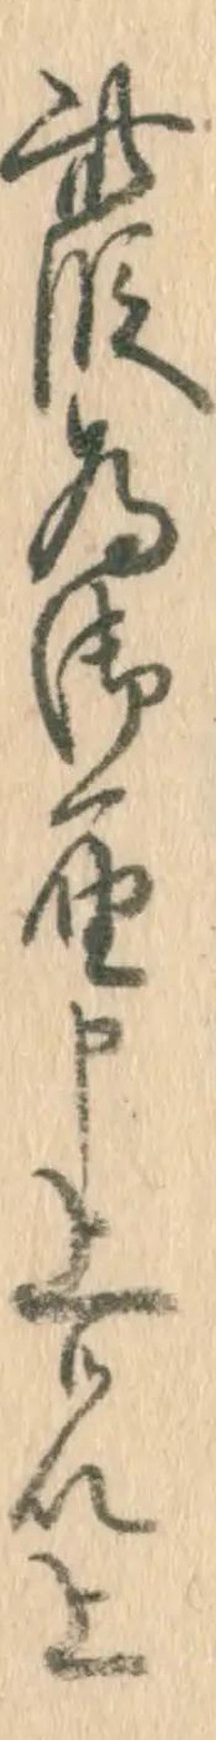此段為御届申上候以上

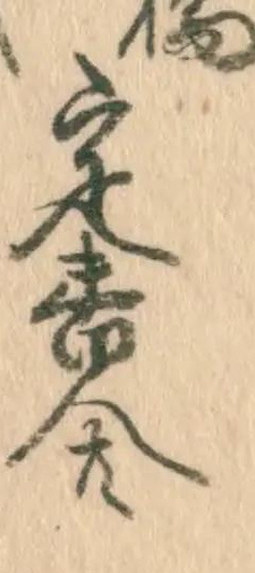定番人共
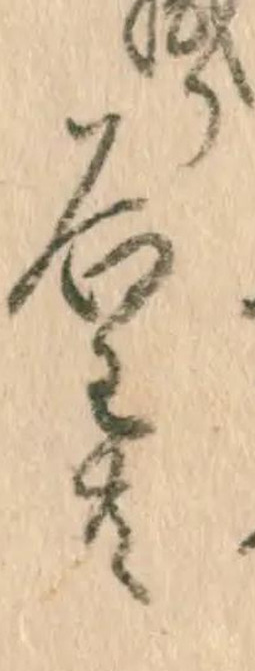名主共

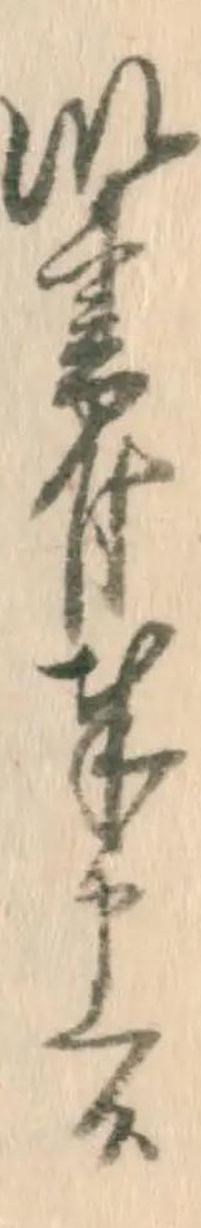以書付奉申上候
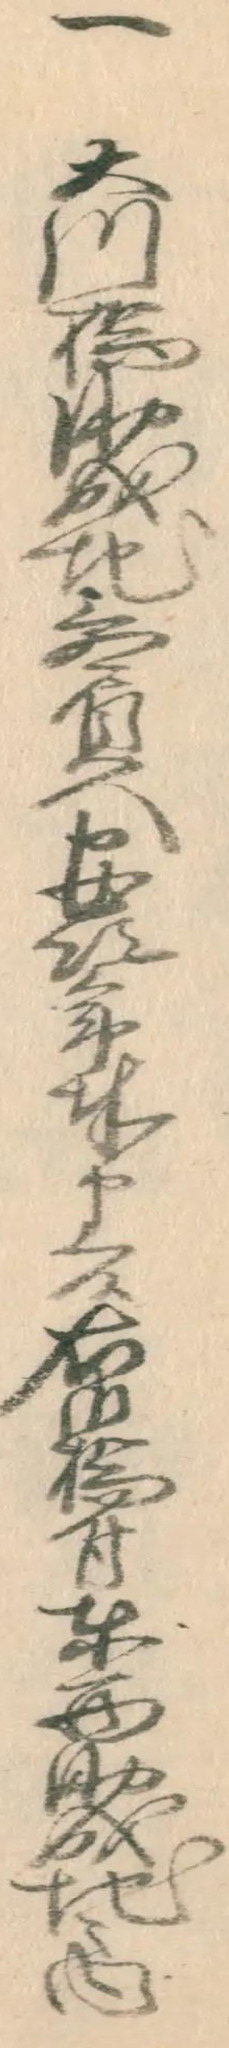一大川橋助成地受負人安次郎奉申上候右御橋付東西助成地之内
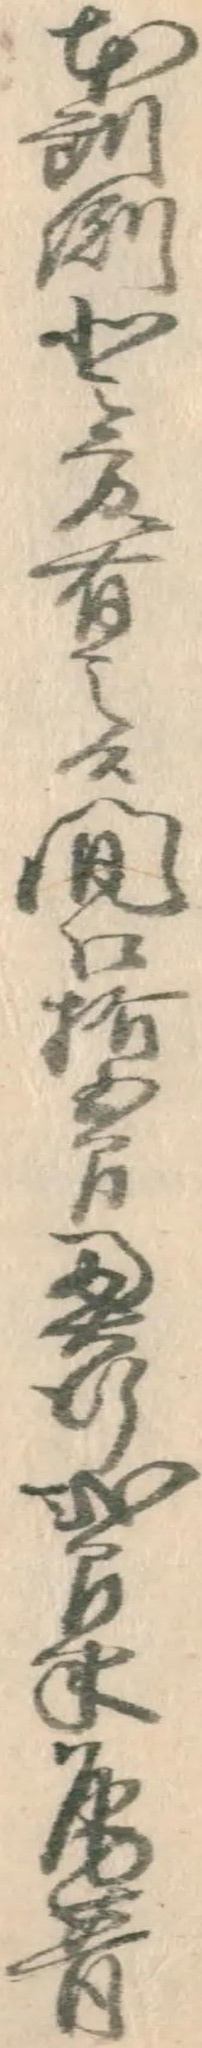本所側北之方ニ有之候間口拾五間奥行弐間半瓦葺
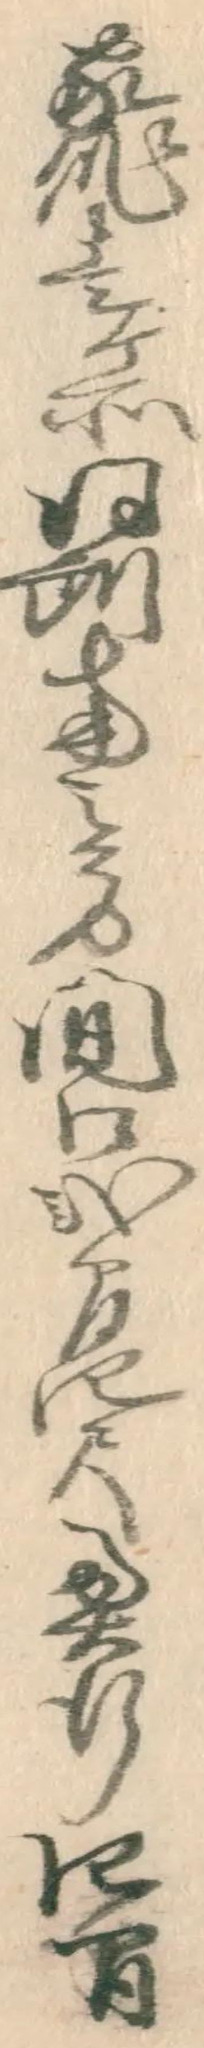家作壱ケ所同所南之方間口弐間四尺奥行四間
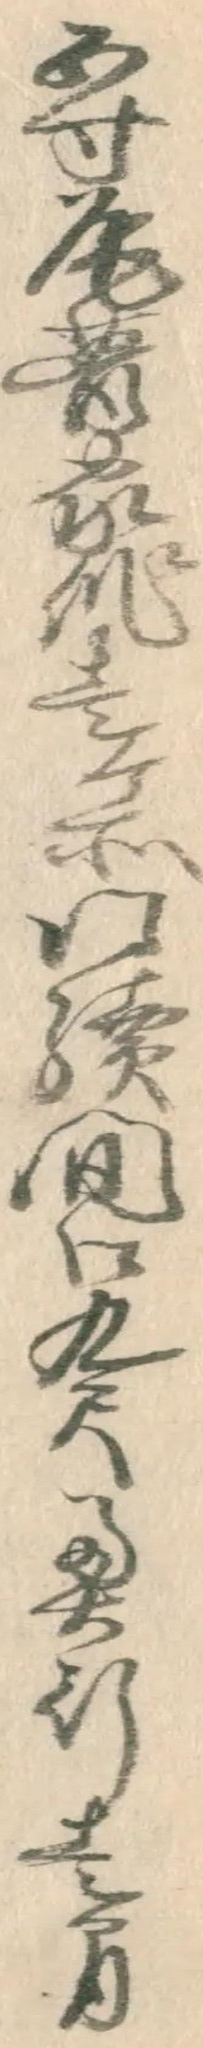五寸瓦葺家作壱ケ所同続間口九尺奥行壱間
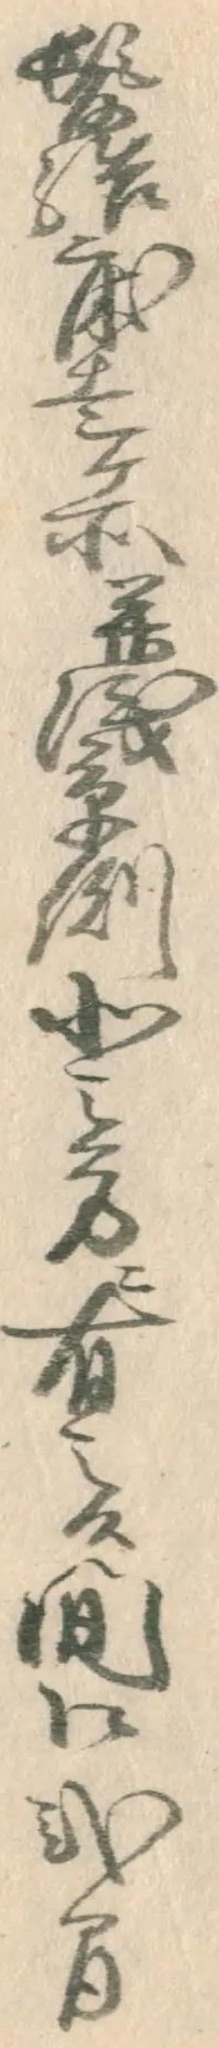髪結床壱ケ所并浅草側北之方ニ有之候間口弐間
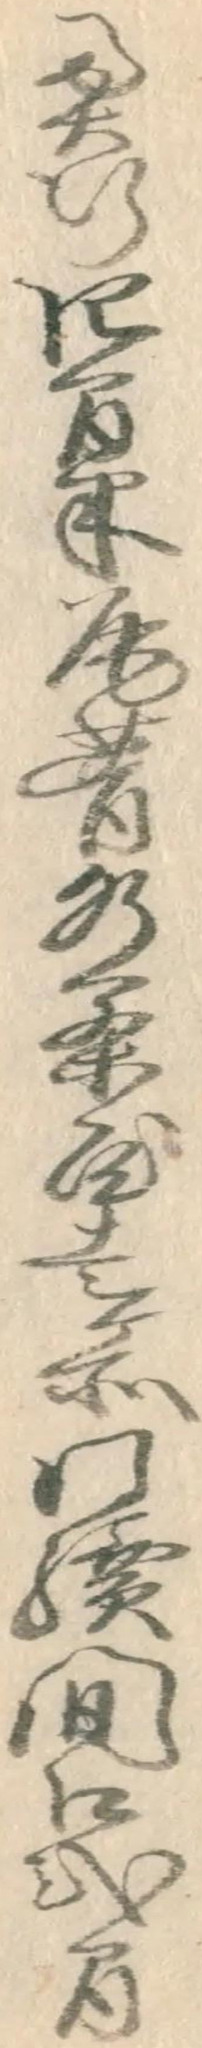奥行四間半瓦葺水茶屋壱ケ所同続間口弐間
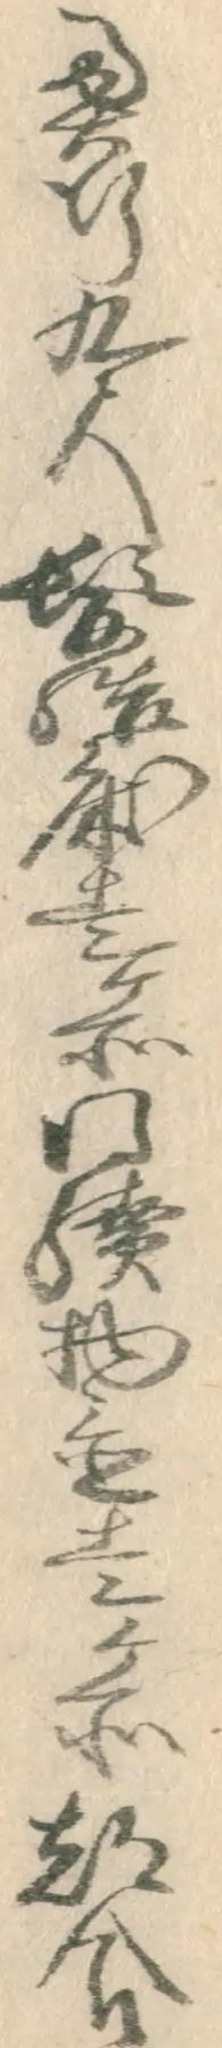奥行九尺髪結床壱ケ所同続物置壱ケ所都合

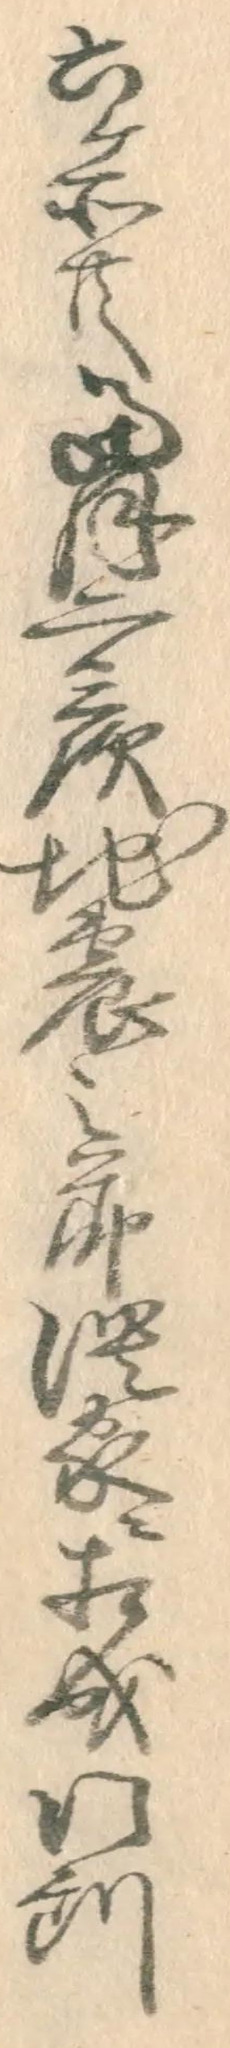六ケ所共当月二日夜地震之節潰家ニ相成同所
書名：三橋 17巻. [8] 三橋小破御修復書留　但御奉行御掛リ替地震潰橋番屋　嘉永四亥年より安政二卯年迄　下
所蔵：国立国会図書館 National Diet Library, JAPAN
